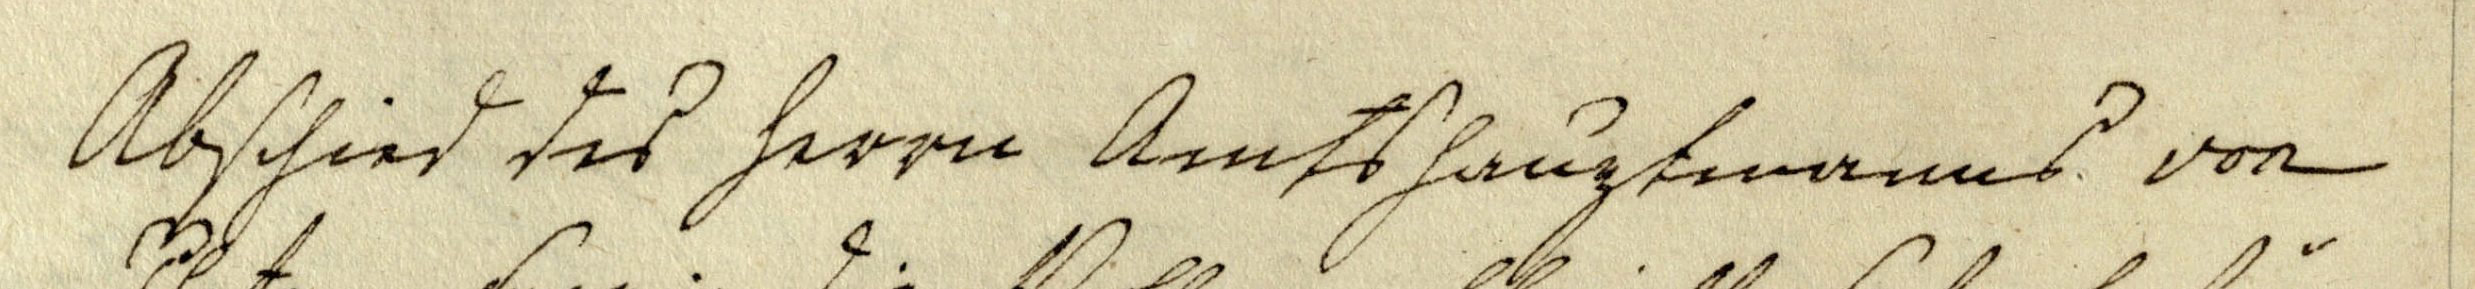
Abschied des Herrn Amtshauptmanns von
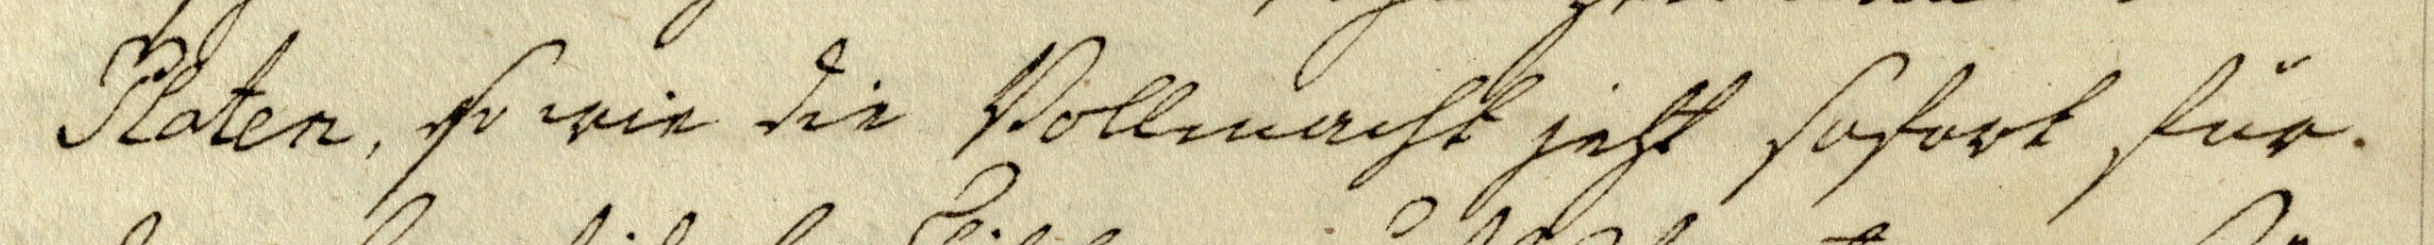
Platen, so wie die Vollmacht jetzt sofort für
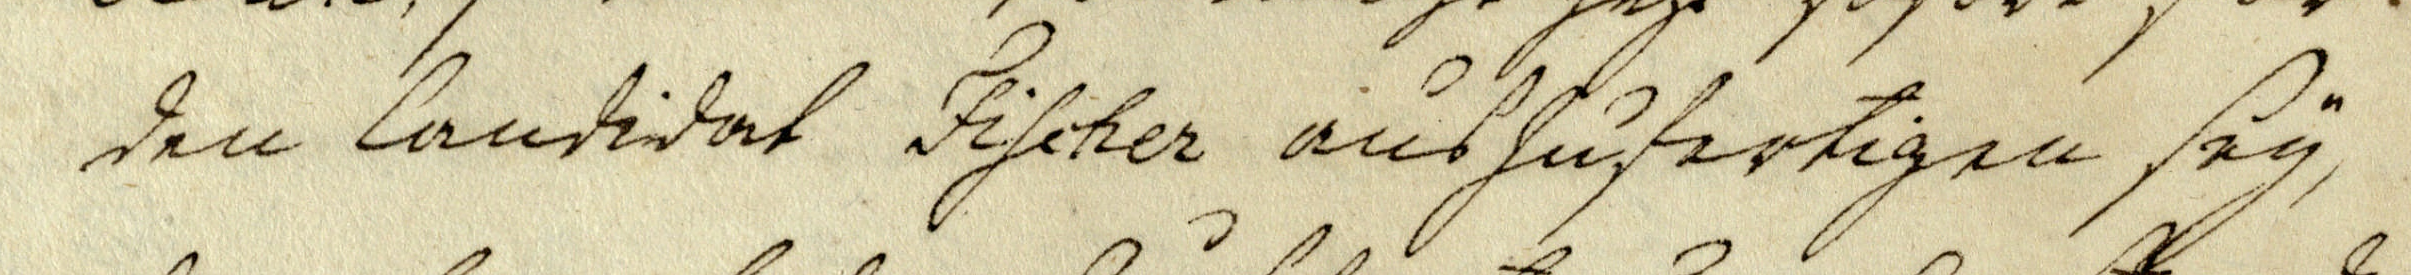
den Candidat Fischer auszufertigen seÿ,
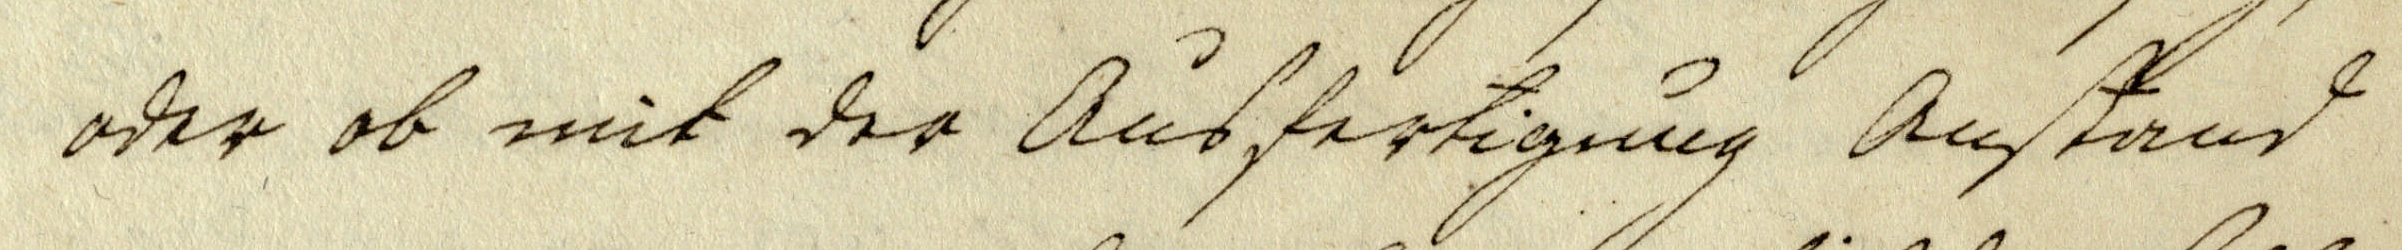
oder ob mit der Ausfertigung Anstand
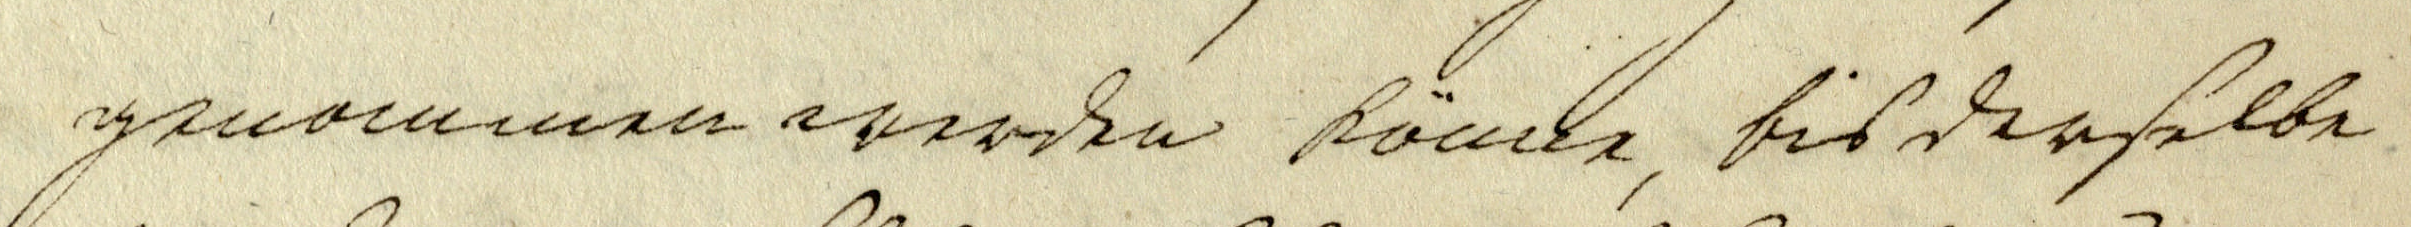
genommen werden könne, bis derselbe
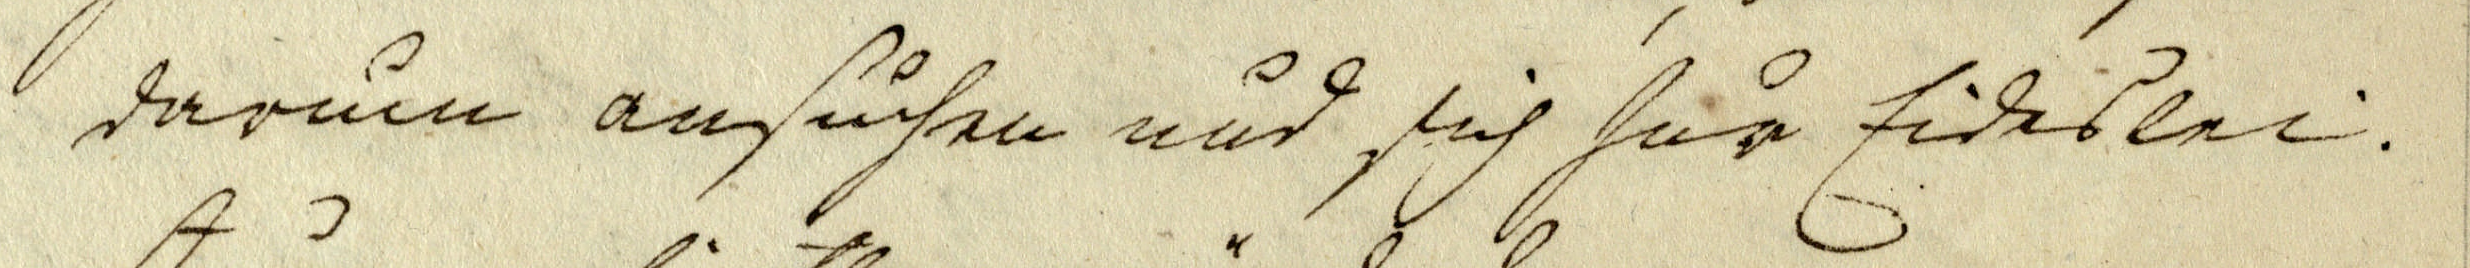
darum ansuchen und sich zur Eideslei¬
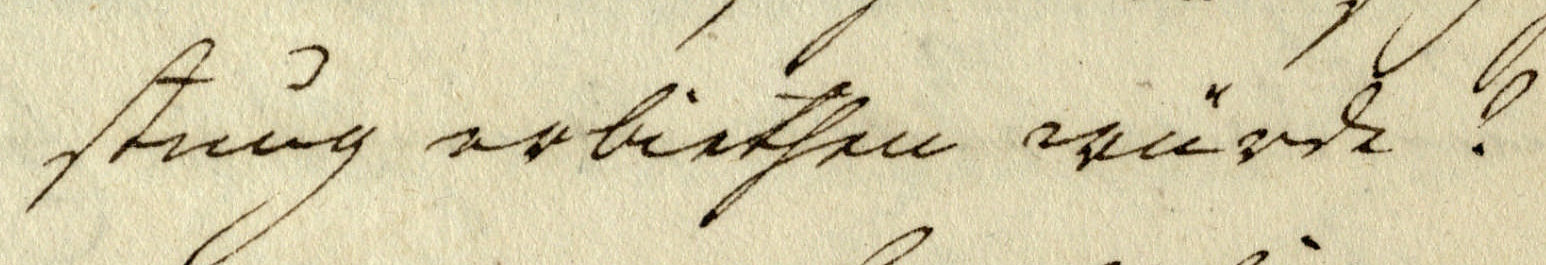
stung erbiethen würde ?
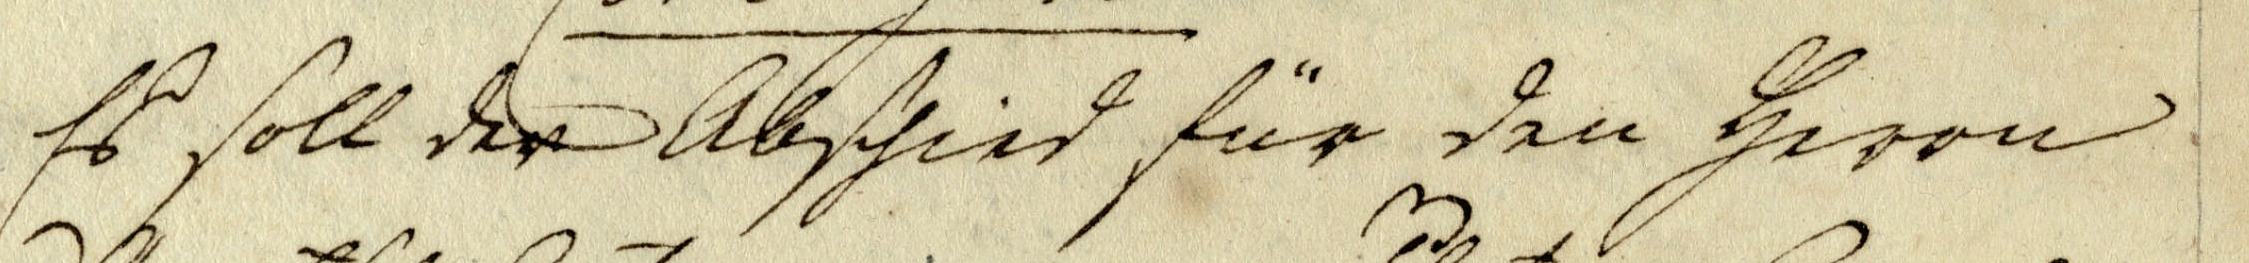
Es soll der Abschied für den Herrn
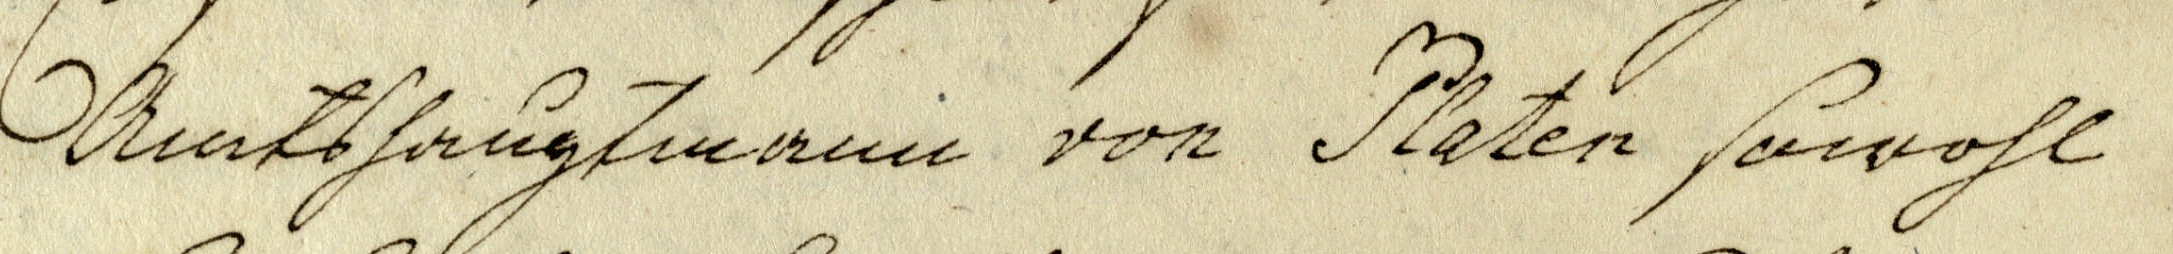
Amtshauptmann von Platen sowohl
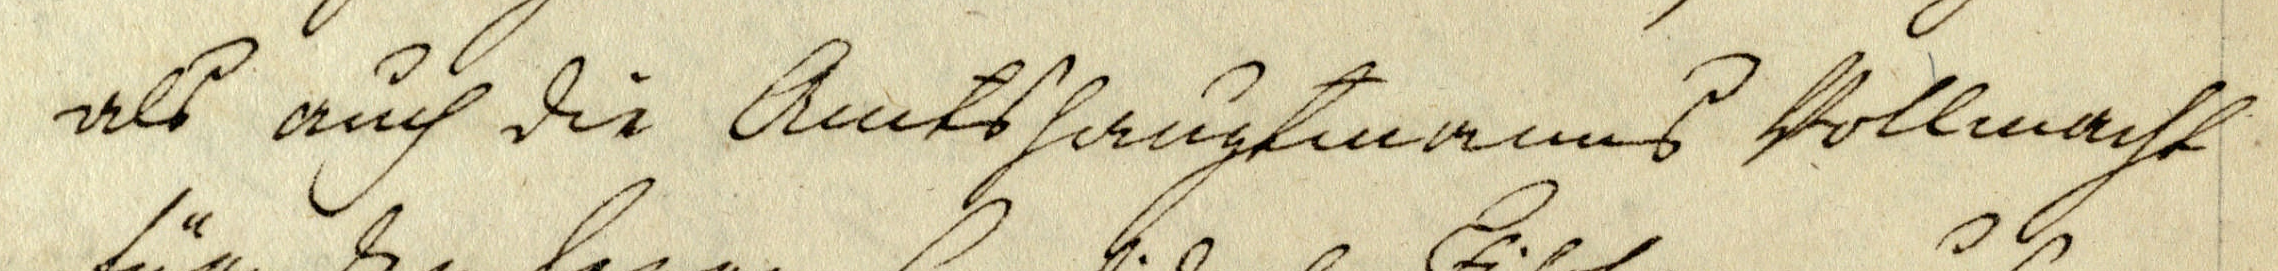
als auch die Amtshauptmanns Vollmacht
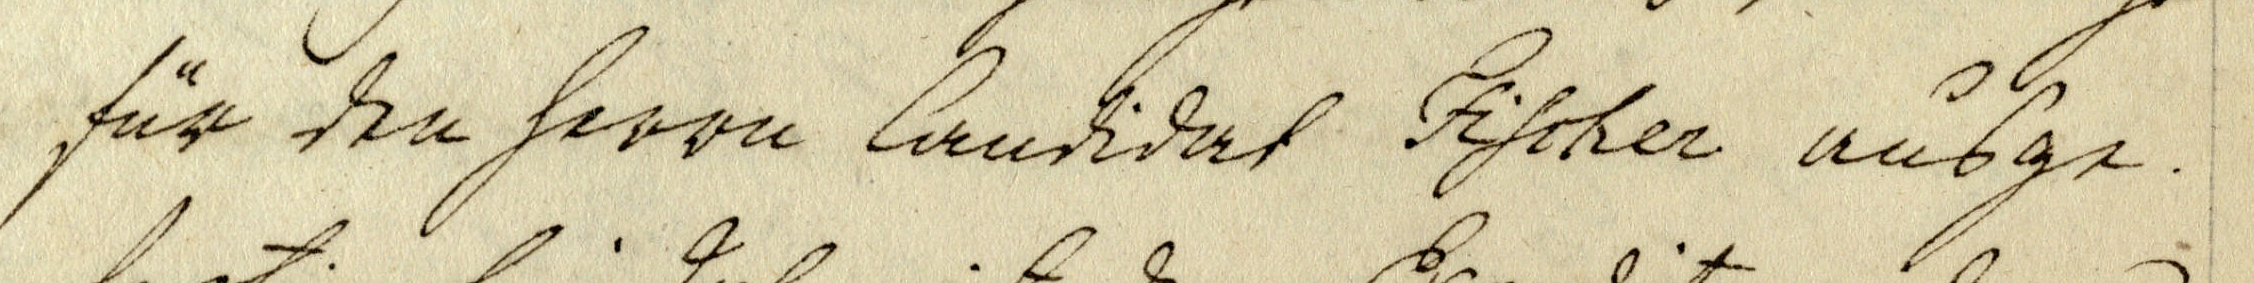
für den Herrn Candidat Fischer ausge¬
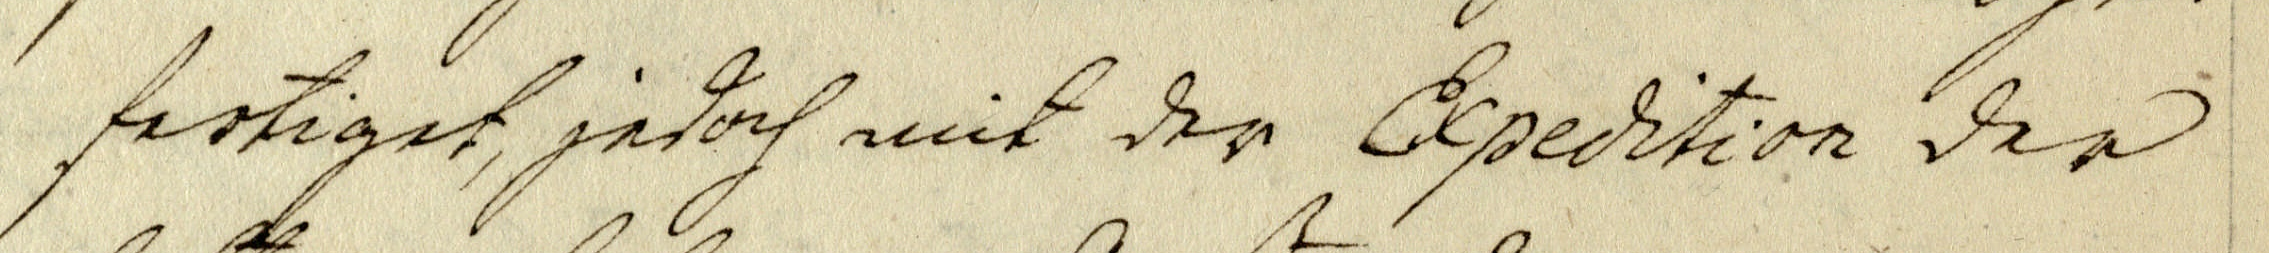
fertiget, jedoch mit der Expedition der
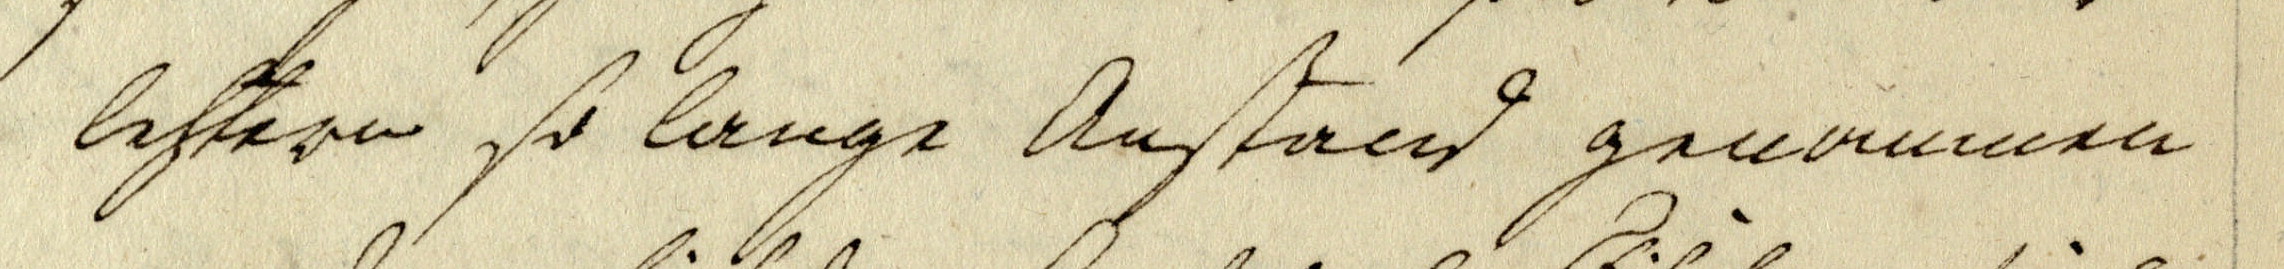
letztern so lange Anstand genommen
